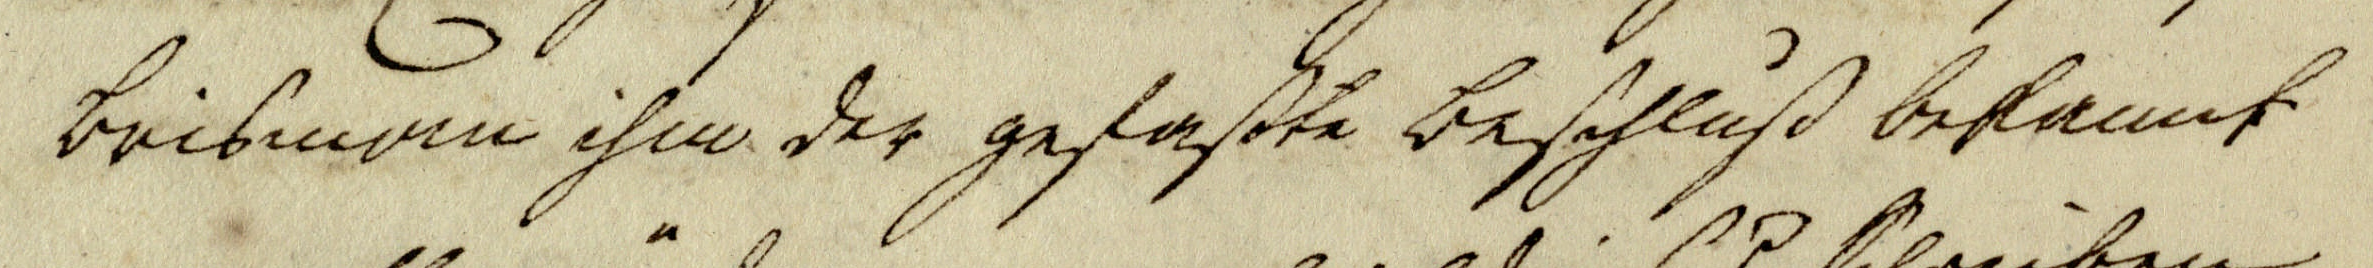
Brisman ihm der gefaßte Beschluß bekannt
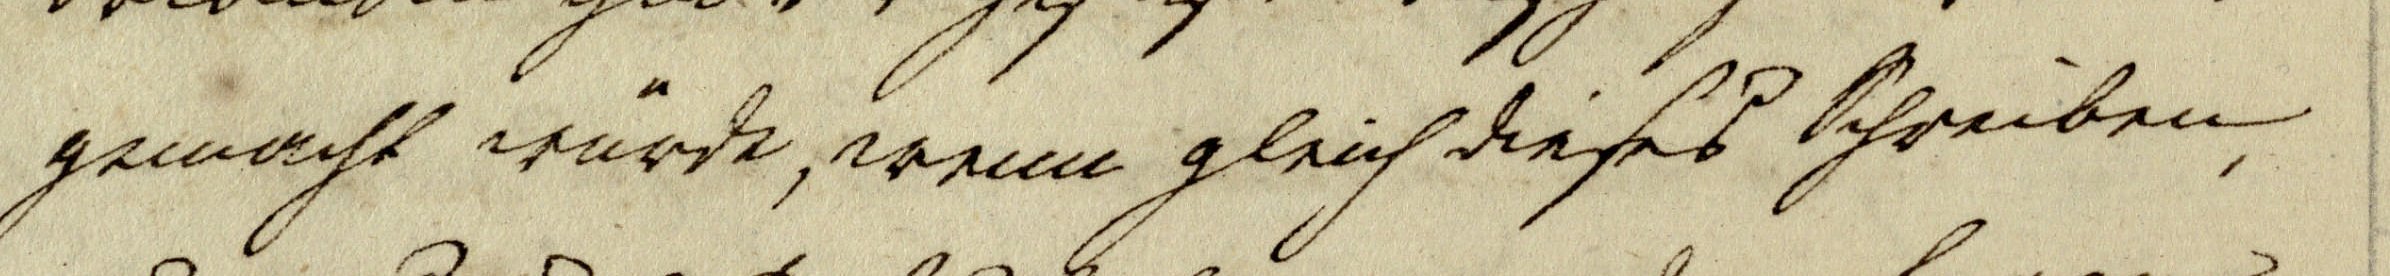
gemacht würde, wenn gleich dieses Schreiben,
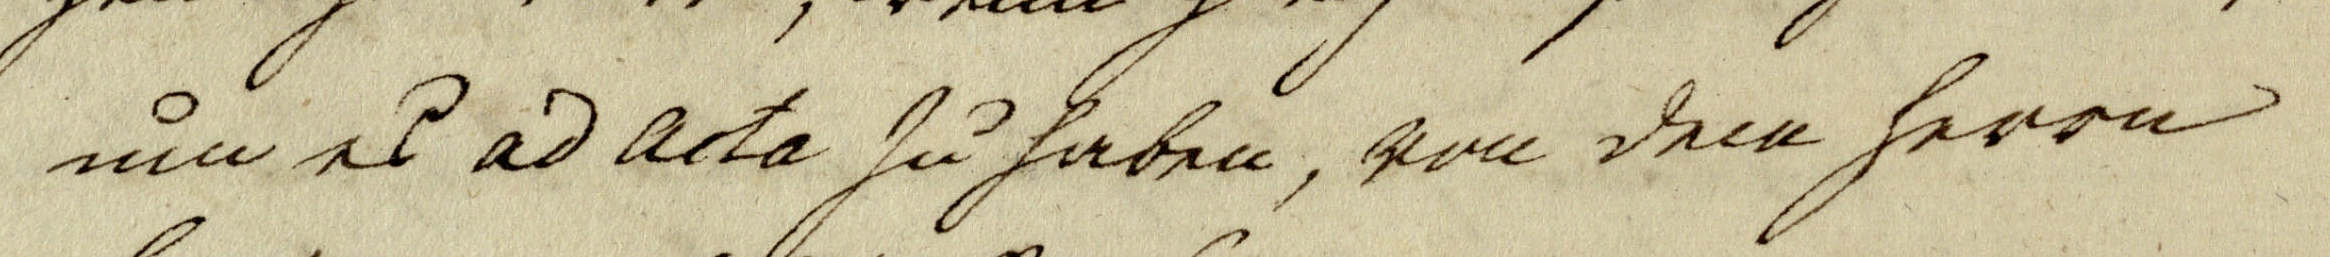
um es ad Acta zu haben, von dem Herrn
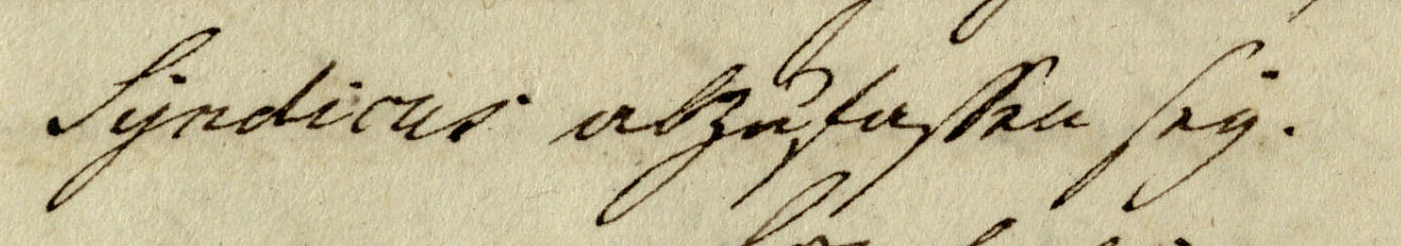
Sÿndicus abzufassen seÿ.
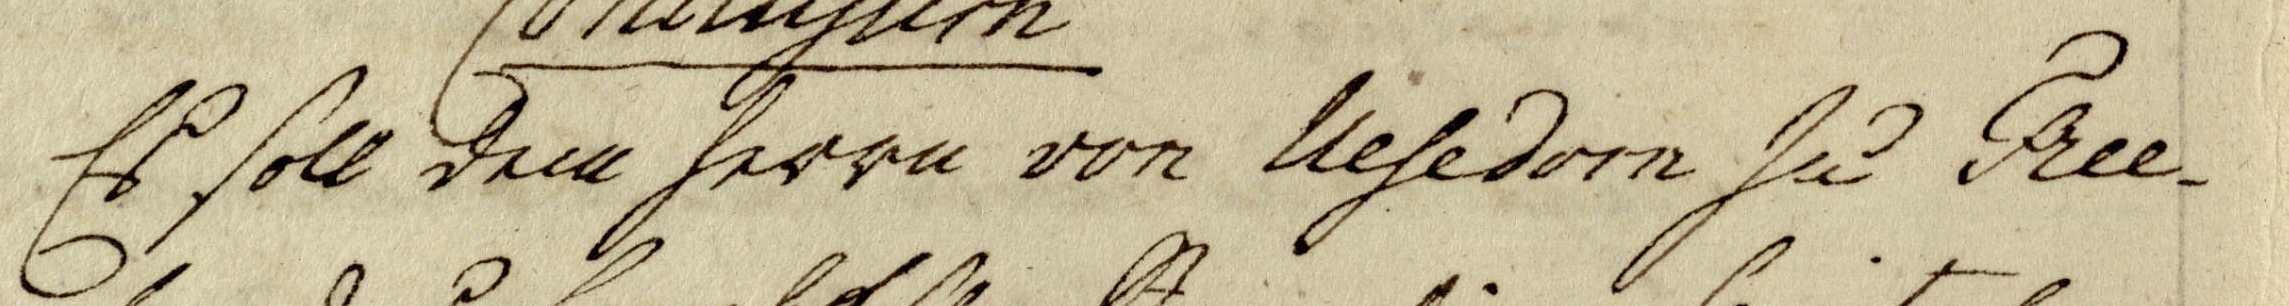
Es soll dem Herrn von Uesedom zu Free¬
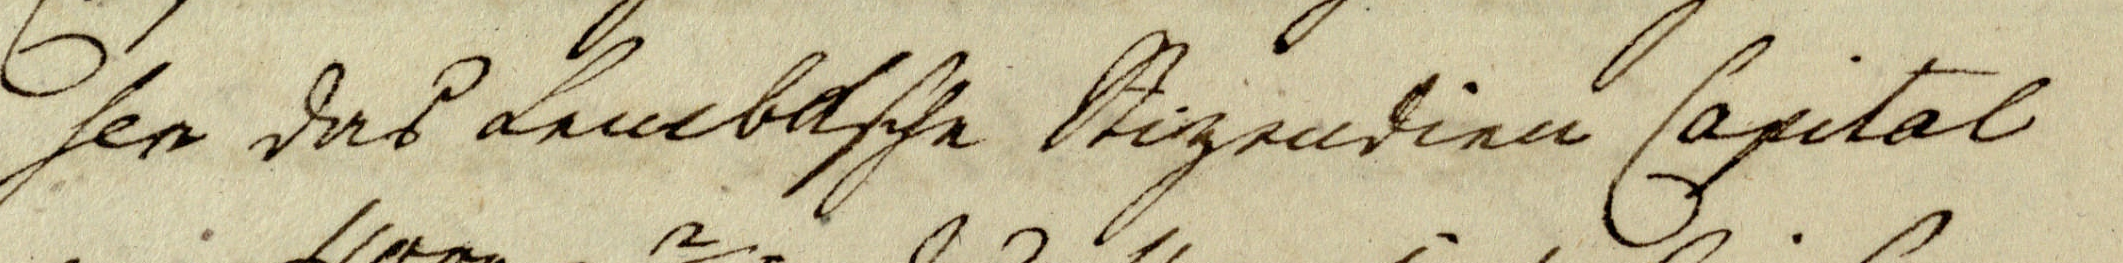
sen das Lembksche Stipendien Capital
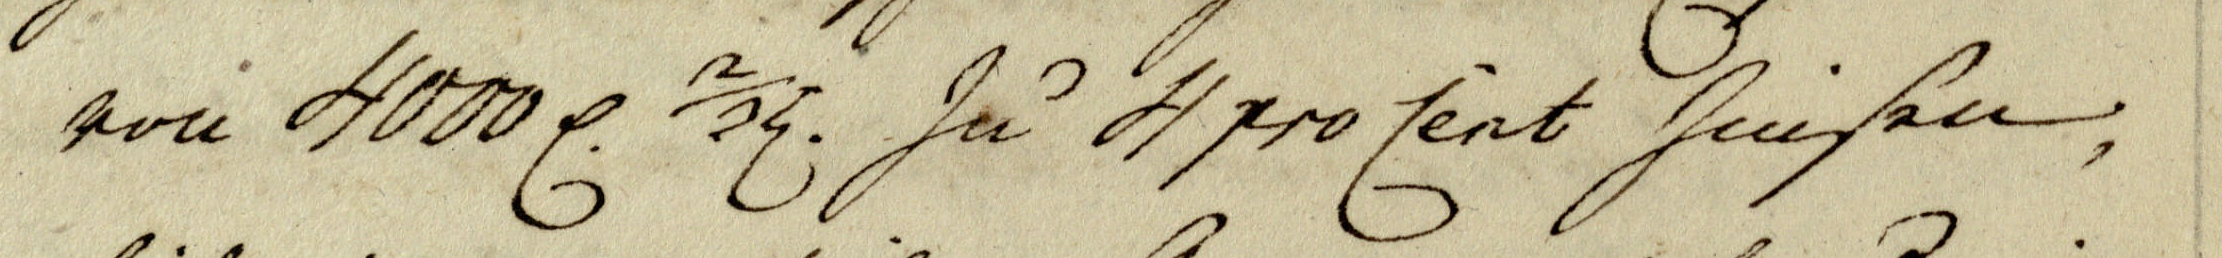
von 4000 l., ¾ h. zu 4 pro Cent Zinsen,
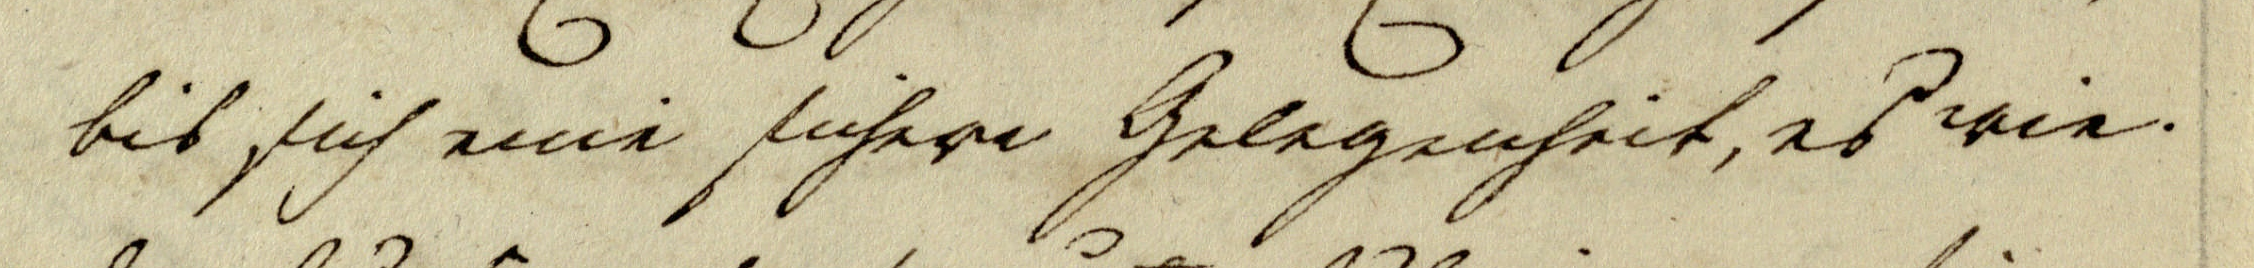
bis sich eine sichere Gelegenheit, es wie¬
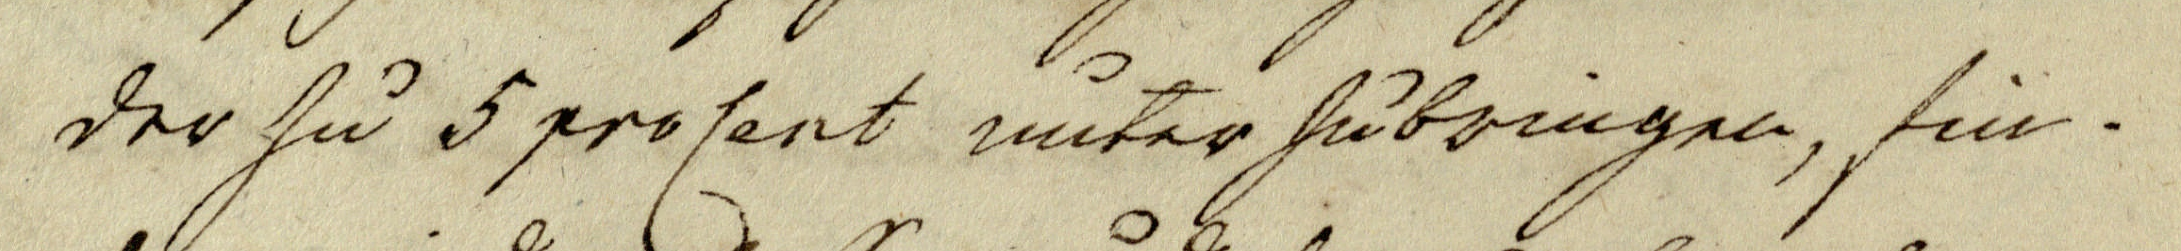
der zu 5 pro cent unter zubringen, fin¬
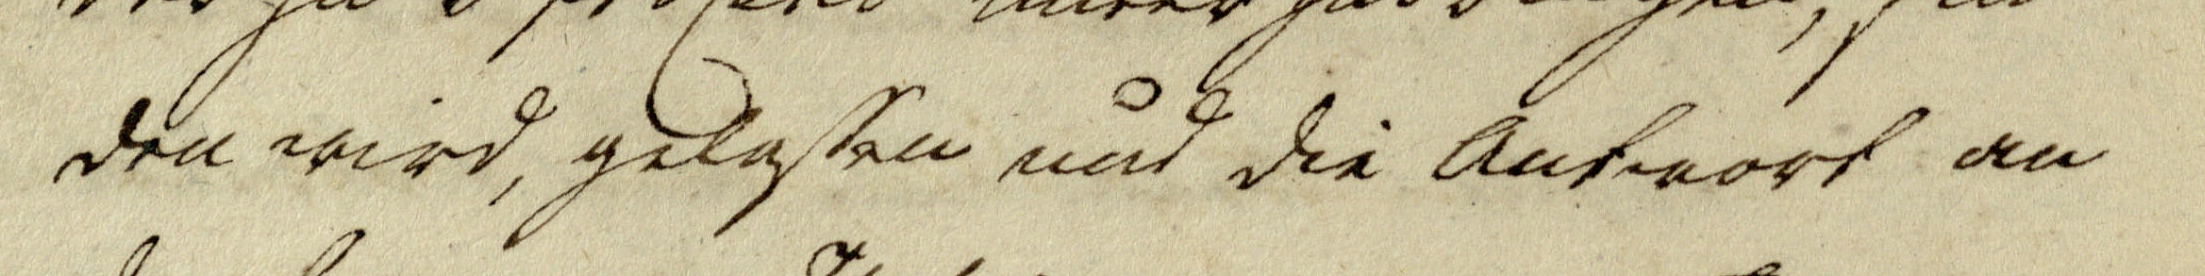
den wird, gelassen und die Antwort an
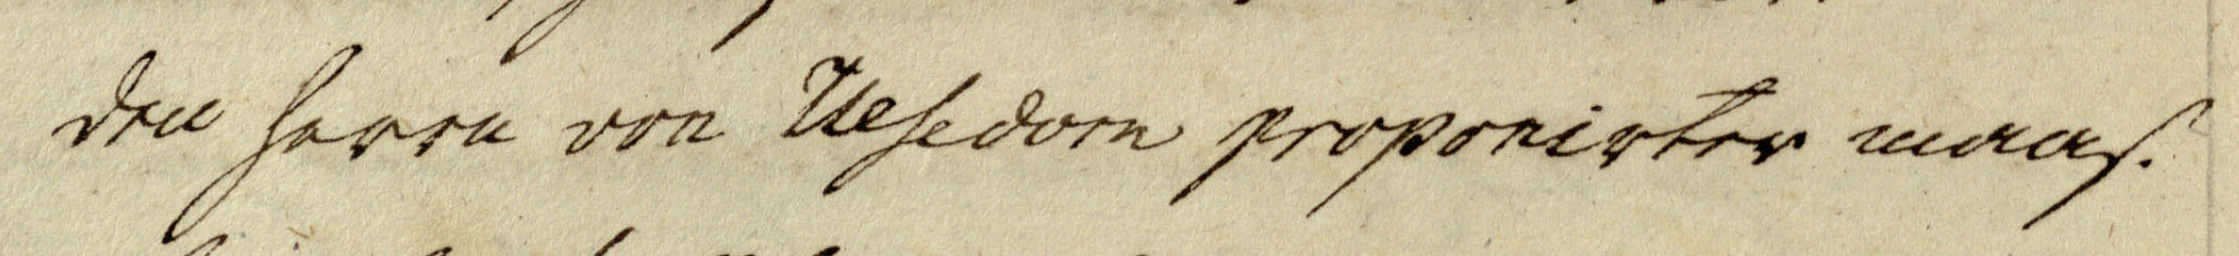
den Herrn von Uesedom proponirter maas¬
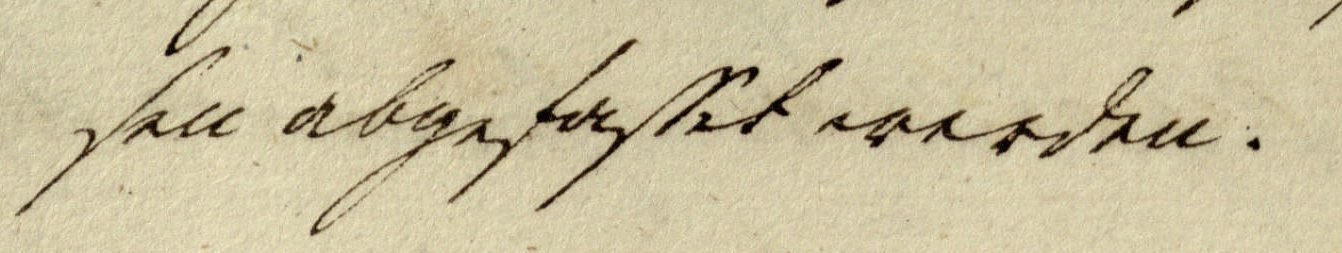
sen abgefasset werden.
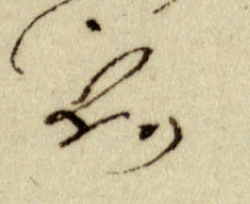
2.,
